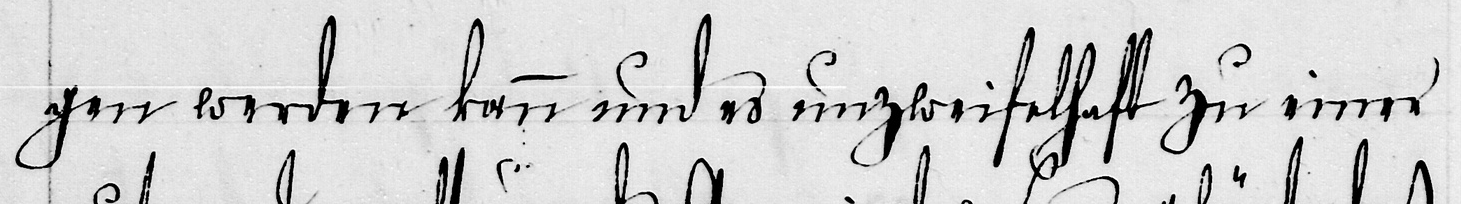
gen werden kann und es unzweifelhaft zu einer
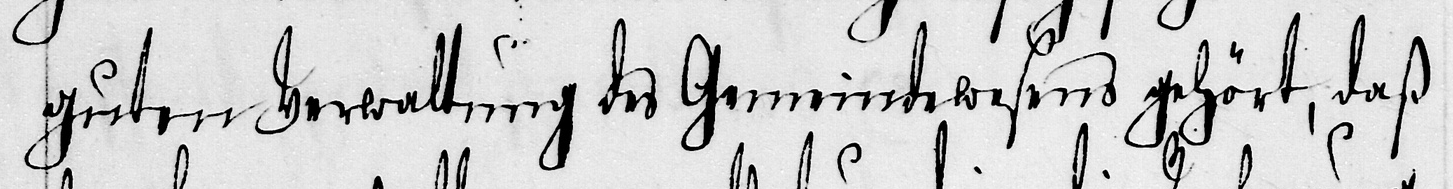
guten Verwaltung des Gemeindewesens gehört, daß
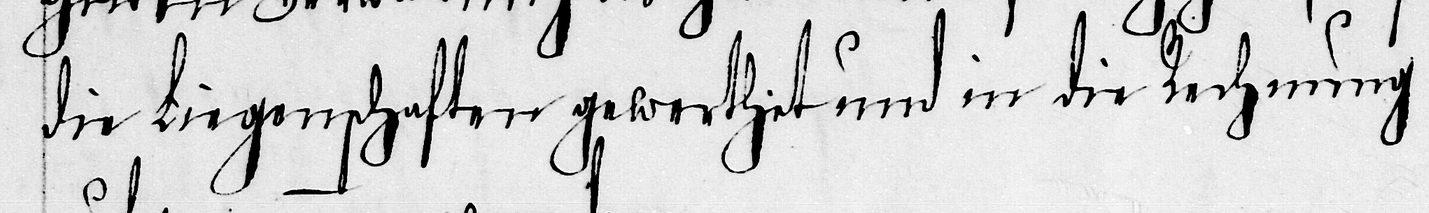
die Liegenschaften gewerthet und in die Rechnung
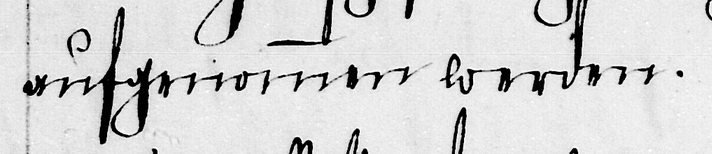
aufgenommen werden.
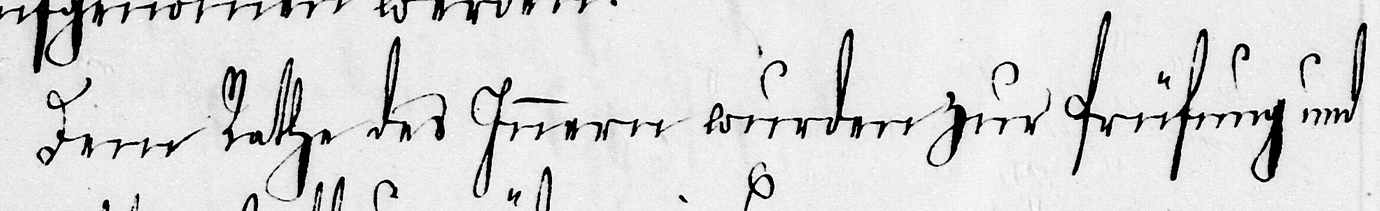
Dem Rathe des Innern wurden zur Prüfung und
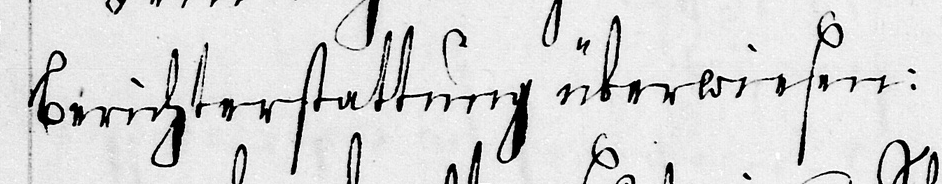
Berichterstattung überwiesen:
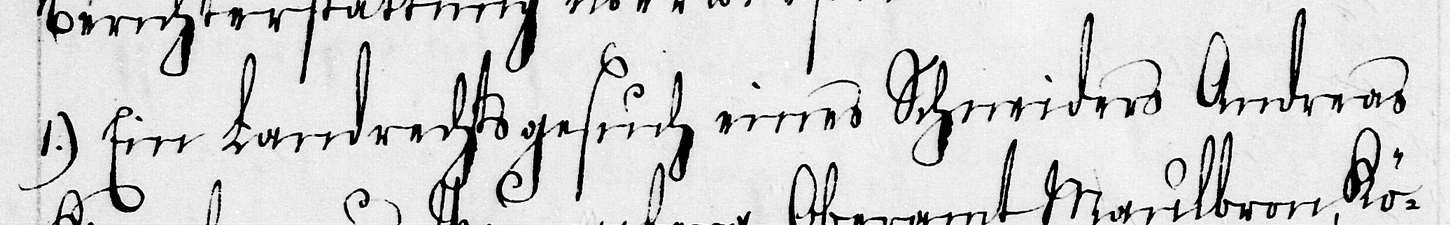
1.) Ein Landrechtsgesuch eines Schneiders Andreas
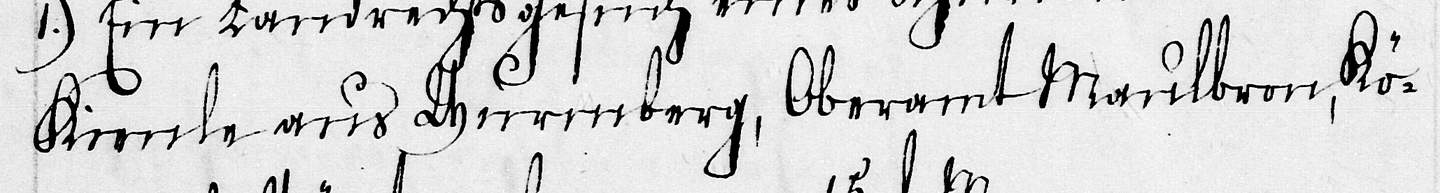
Kienle aus Wurmberg, Oberamt Maulbron, Kö¬
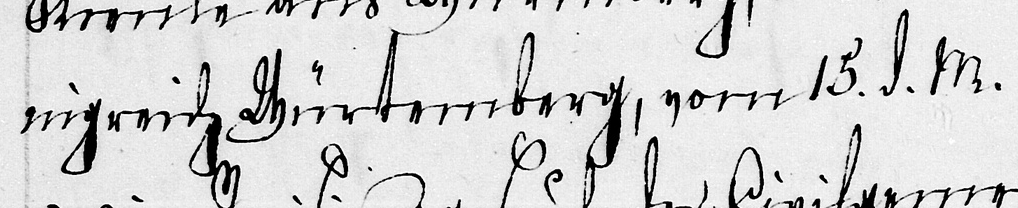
nigreich Würtemberg, vom 15. d. M.
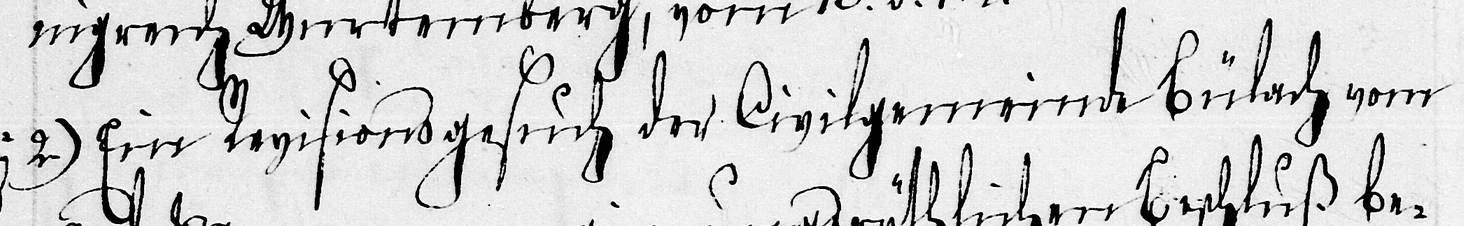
2.) Ein Revisionsgesuch der Civilgemeinde Bülach vom
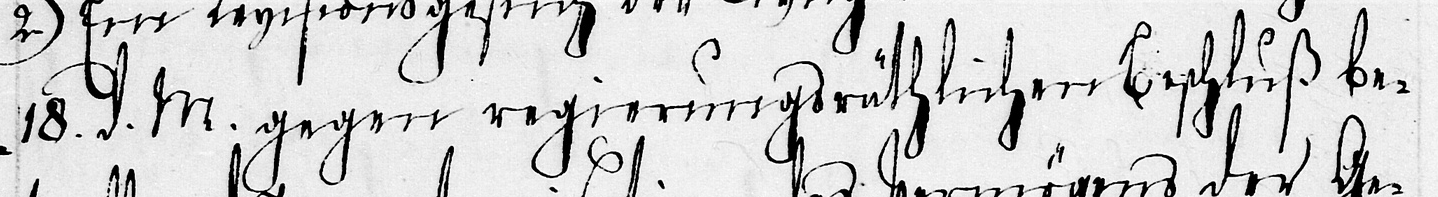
18. d. M. gegen regierungsräthlichen Beschluß be¬
